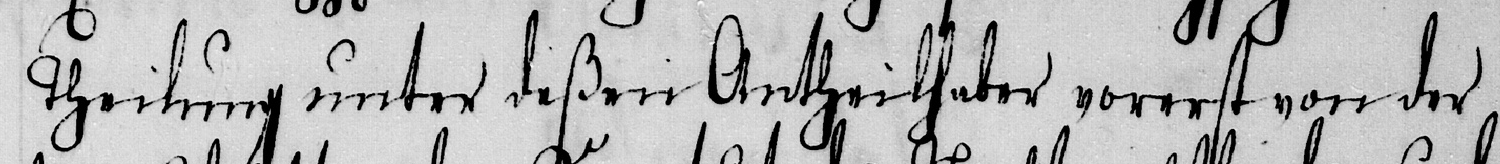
Theilung unter deßen Antheilhaber vorerst von der
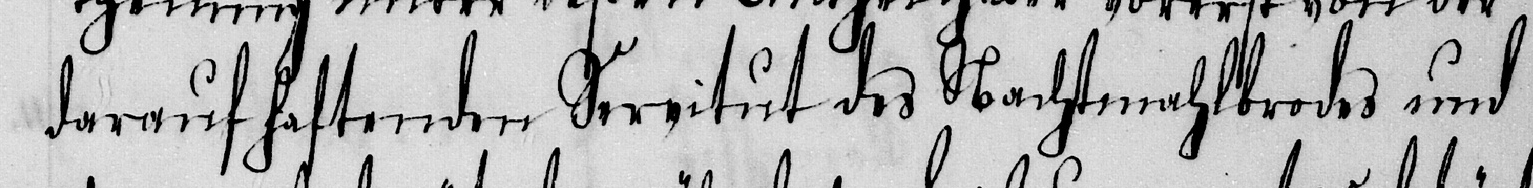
darauf haftenden Servitut des Nachtmahlbrodes und
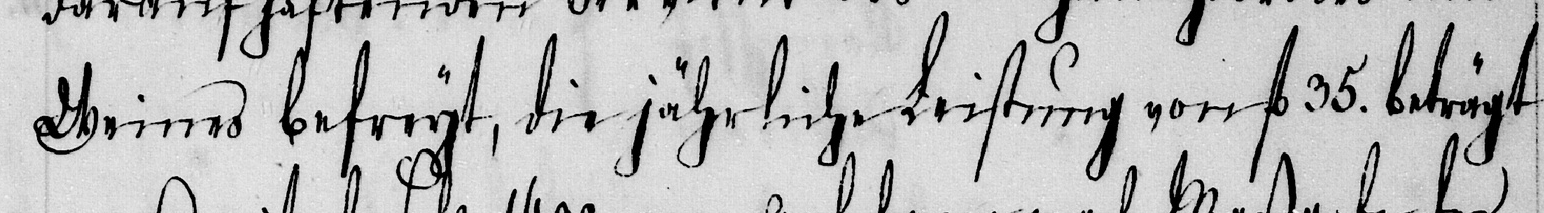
Weines befreyt, die jährliche Leistung von fl. 35. bet¬
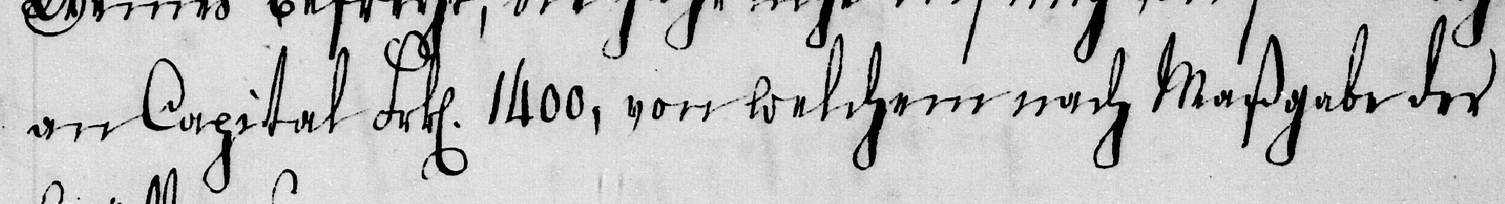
an Capital Frk[en]. 1400, von welchem nach Maßgabe der
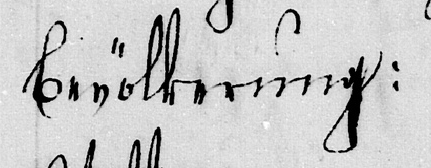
Bevölkerung:
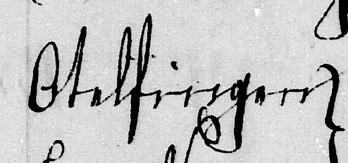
Otelfingen
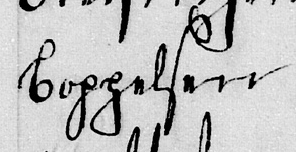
Boppelsen
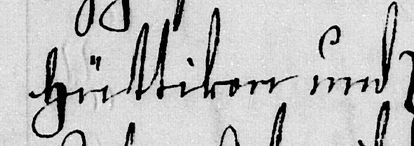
Hüttikon und
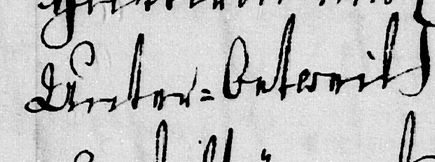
Unter-Oetweil
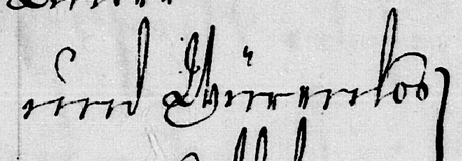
und Würenlos
